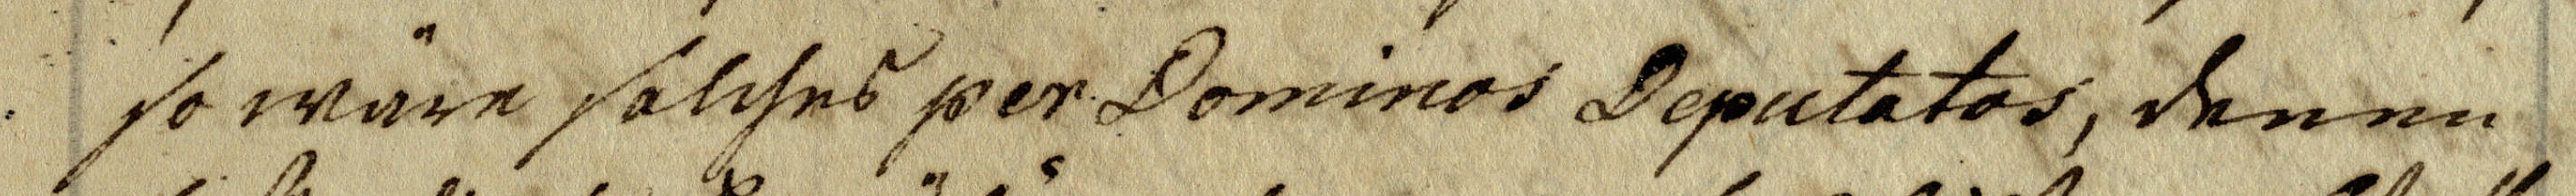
so wäre solches per Dominos Deputatos, denen
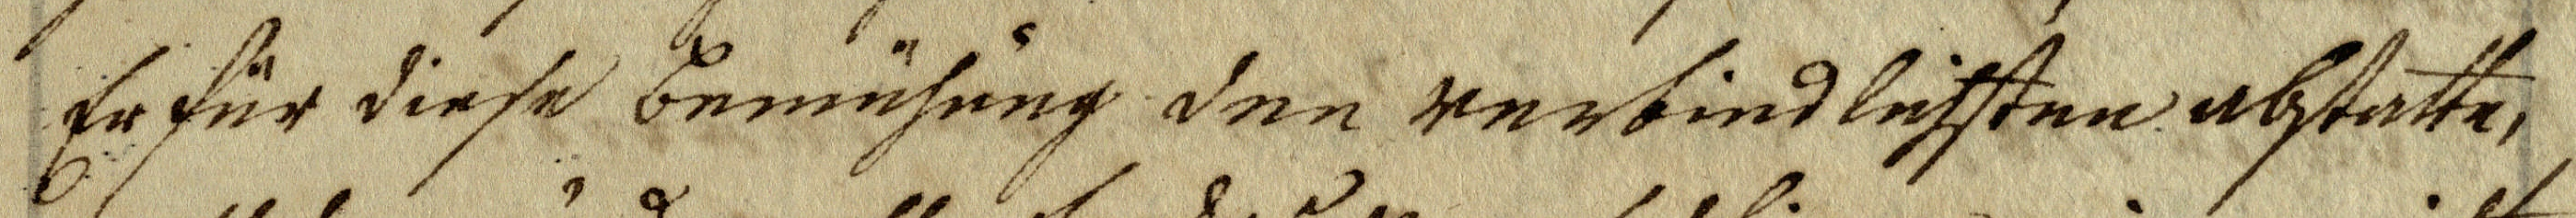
Er für diese Bemühung den verbindlichsten abstatte,
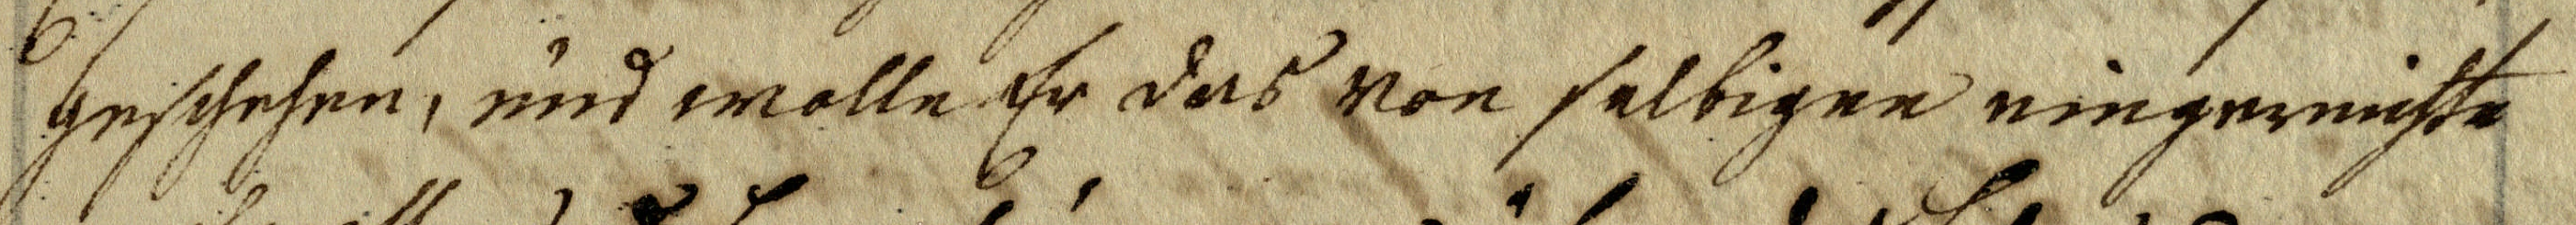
geschehen, und wolle Er das von selbigen eingereichte
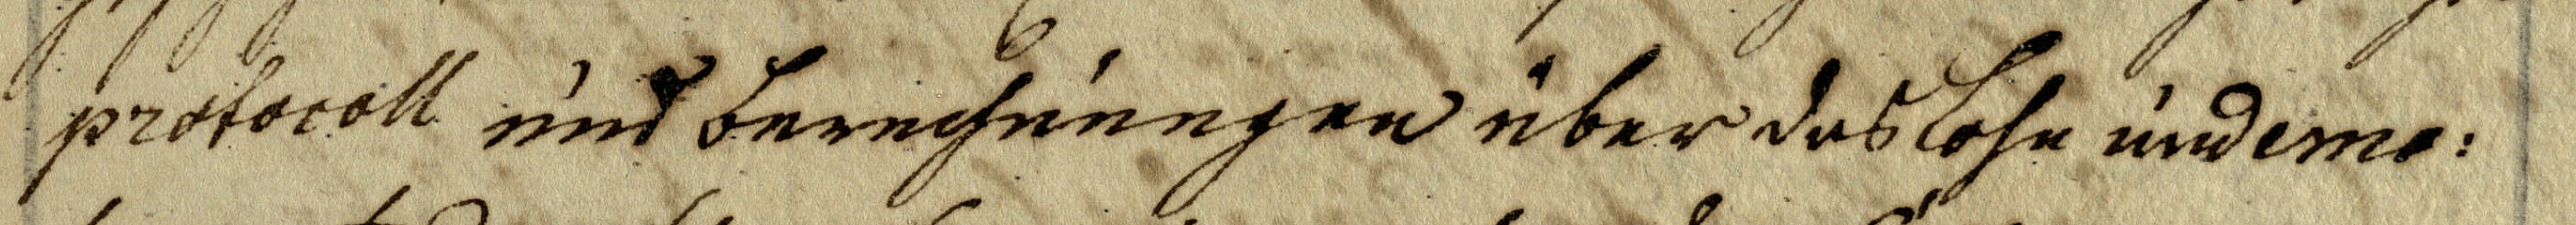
protocoll und Berechnungen über das Lohn und emo¬
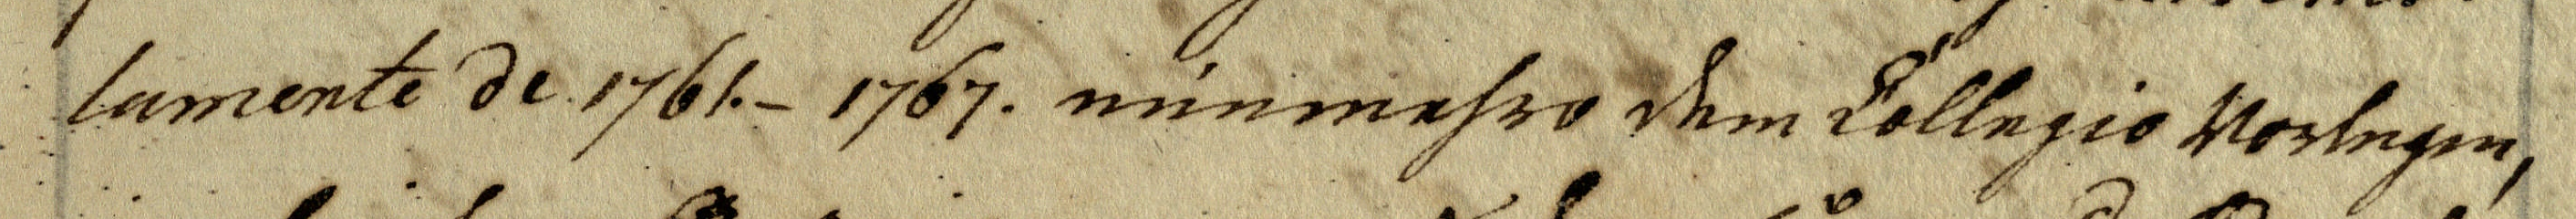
lumente de 1761.-1767. nunmehro dem Collegio vorlegen,
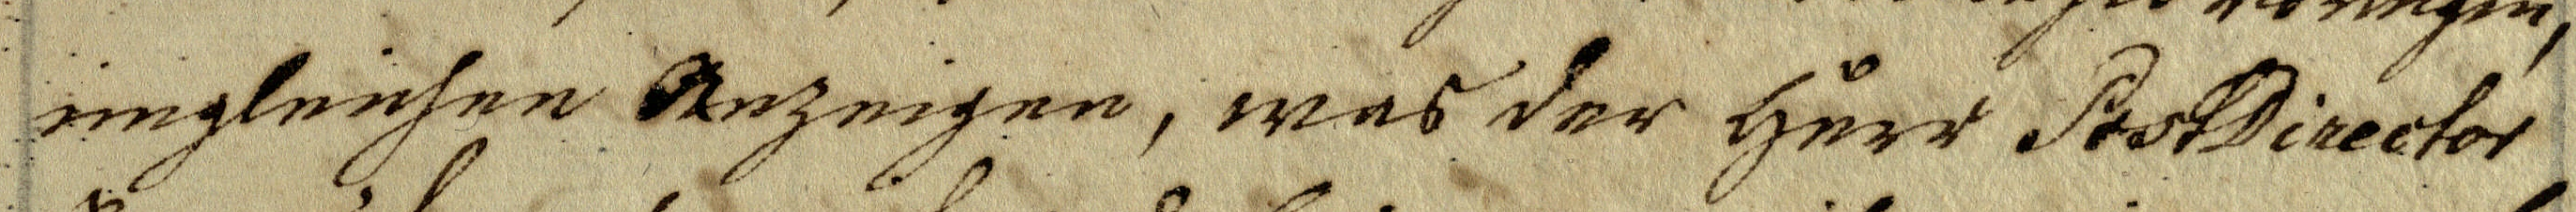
imgleichen Anzeigen, was der Herr PostDirector
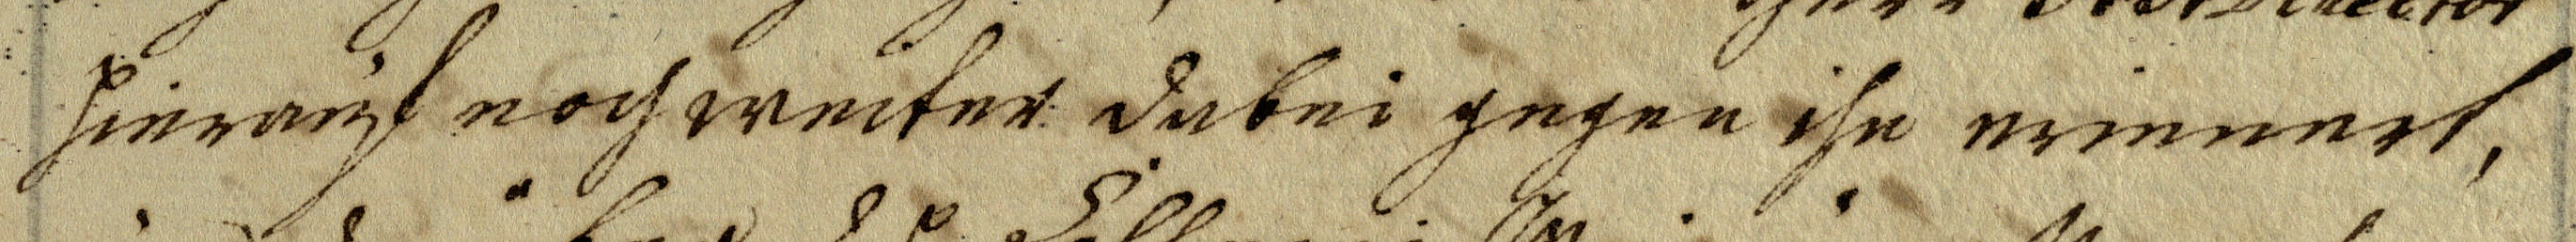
hierauf noch weiter dabei gegen ihn erinnert,
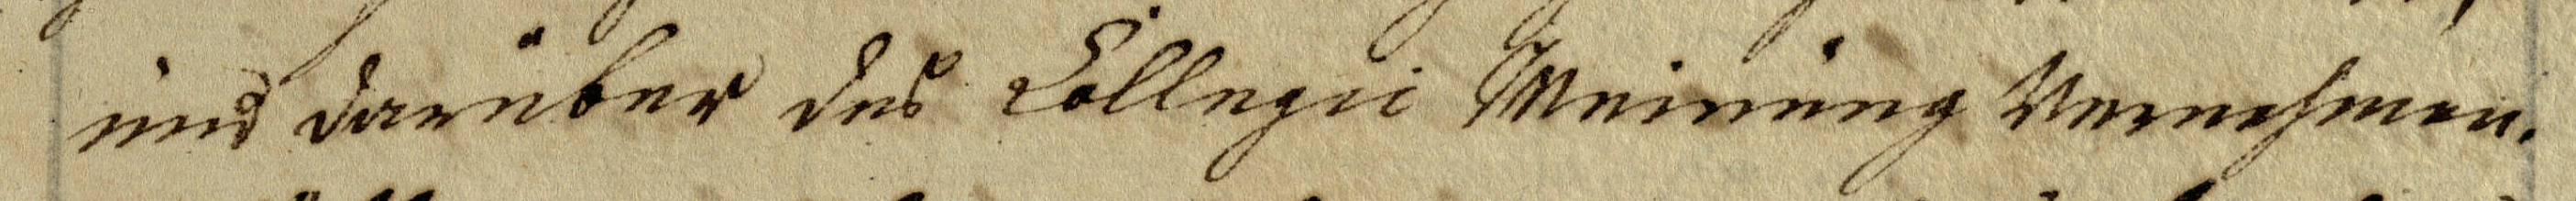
und darüber des Collegii Meinung vernehmen.
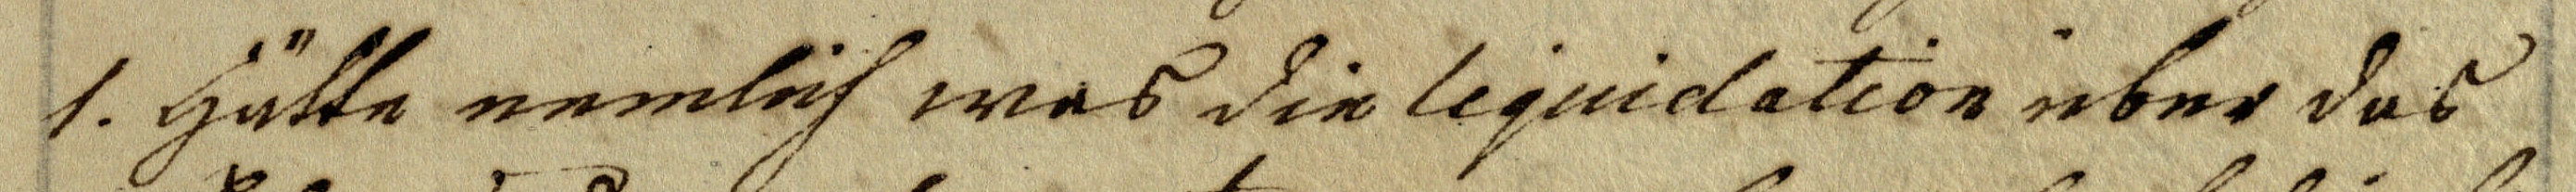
1. Hätte nnemlich was die liquidation über das
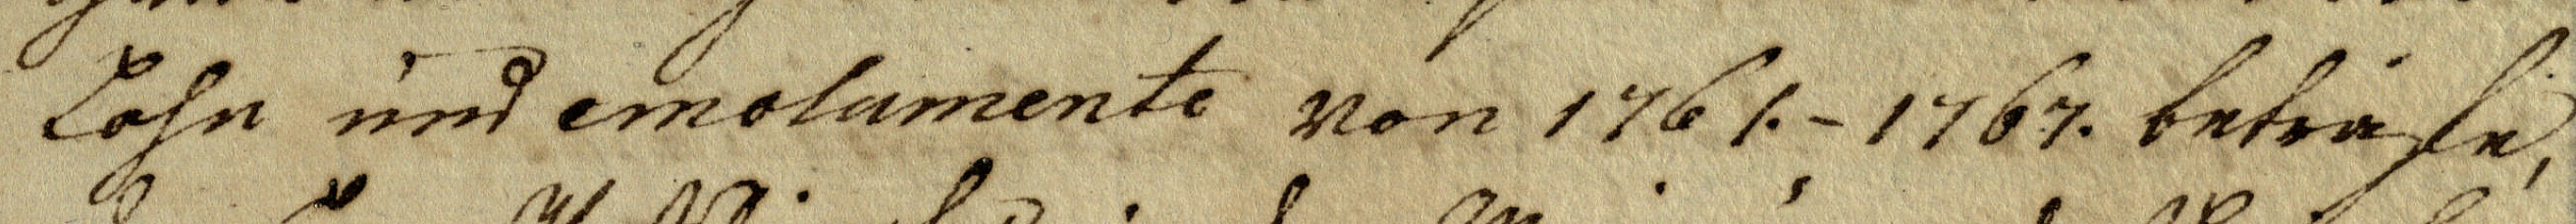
Lohn und emolumente von 1761.-1767. beträfe,
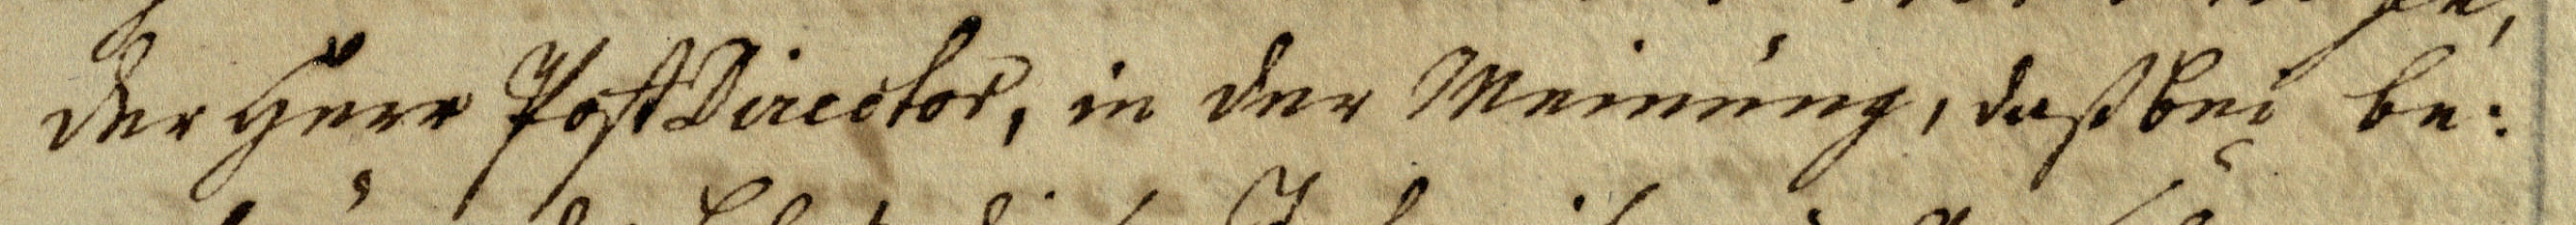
der Herr PostDirector, in der Meinung, daß bei be¬
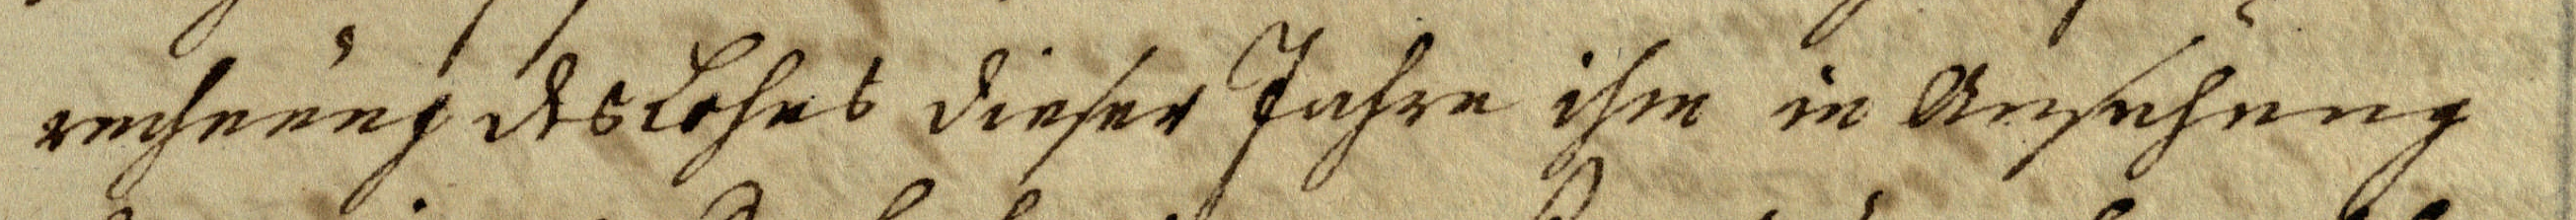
rechnung des Lohns dieser Jahre ihm in Ansehung
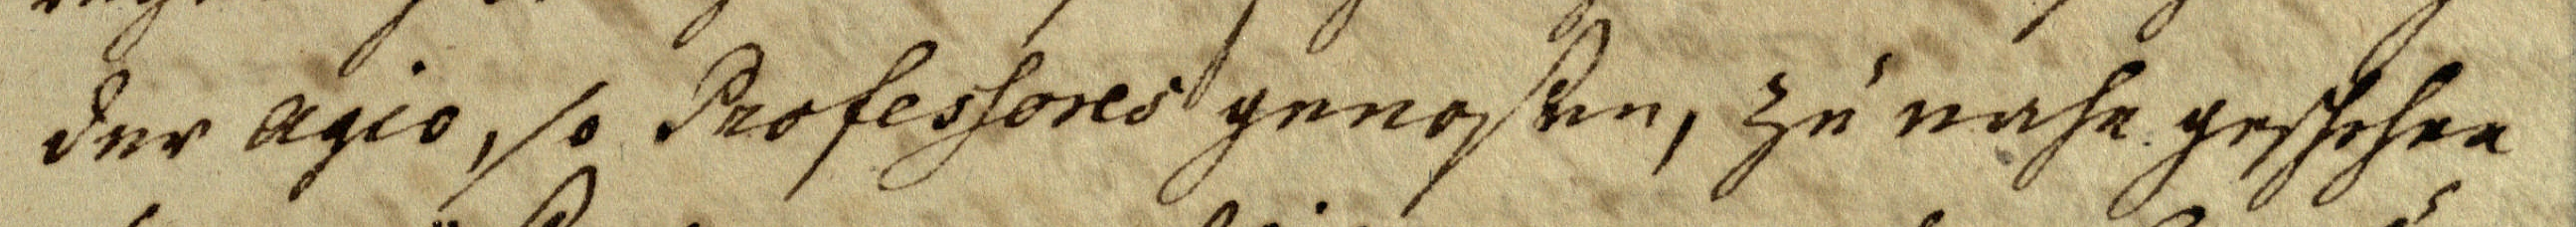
der agio, so Professores genoßen, zu nahe geschehen
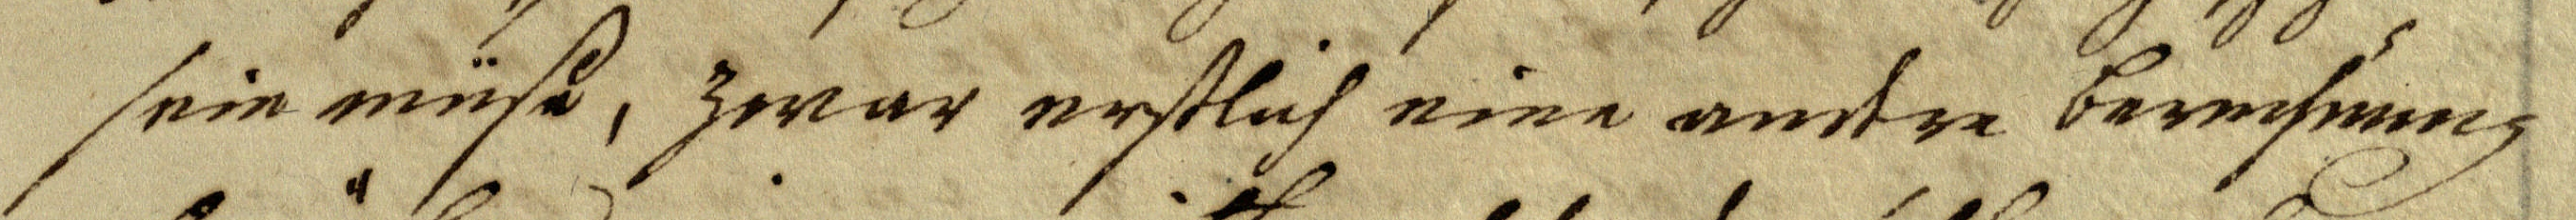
sein müße, zwar erstlich eine andere Berechnung
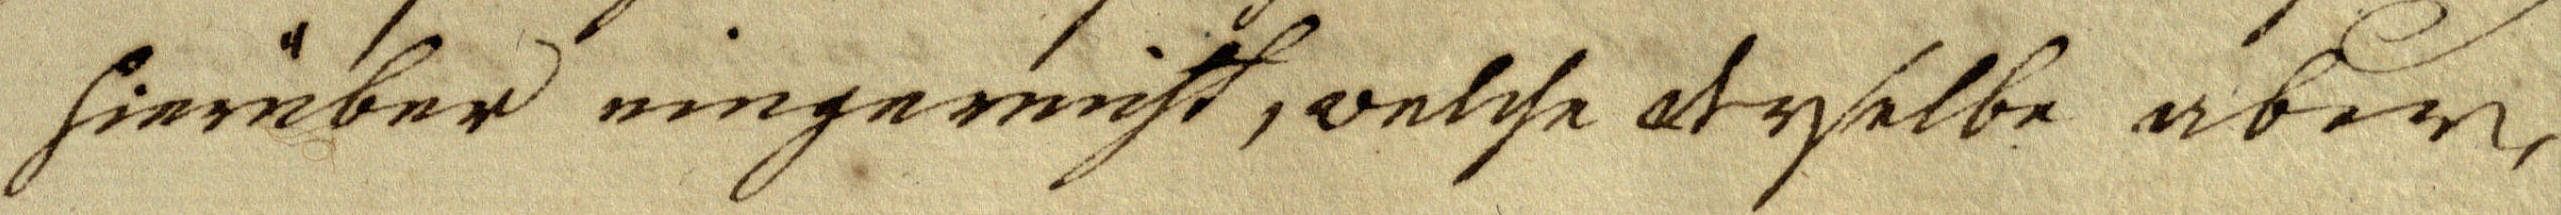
hierüber eingereicht, welche derselbe aber,
